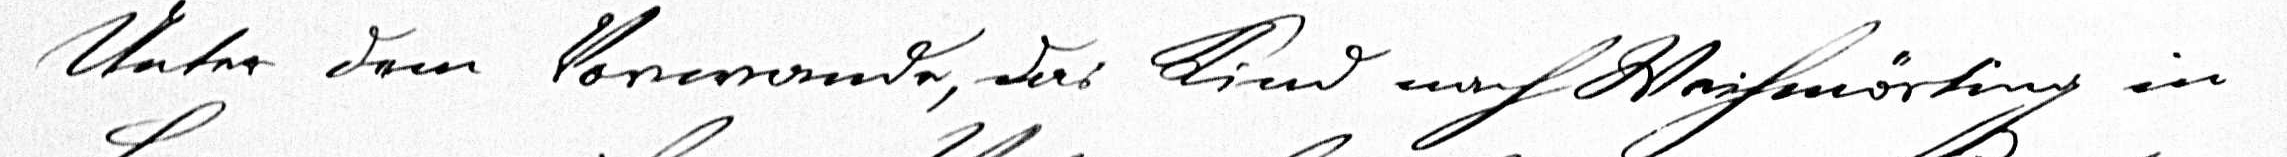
Unter dem Vorwande, das Kind nach Weihmörting in
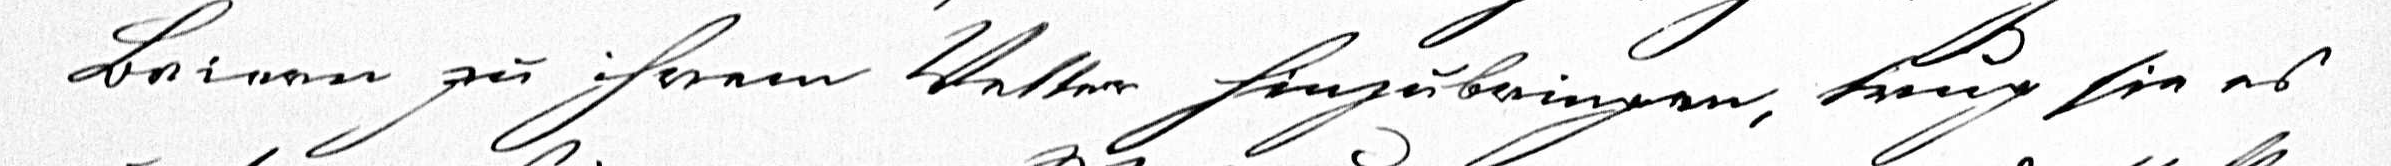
Beiern zu ihrem Vetter hinzubringen, trug sie es
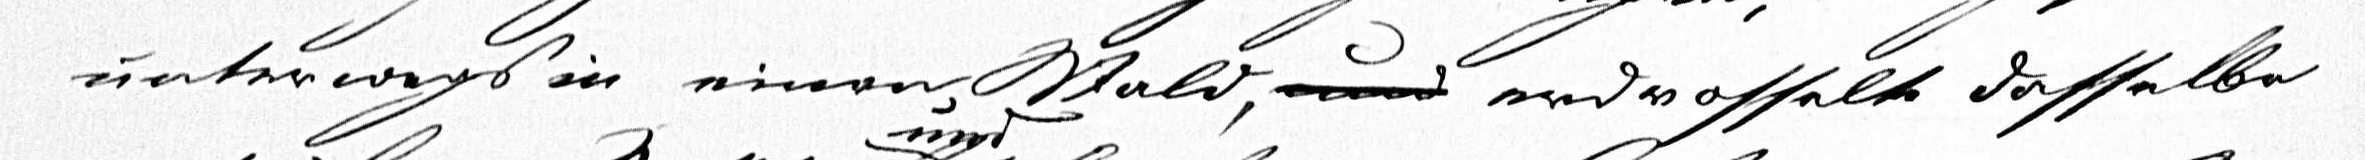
unterwegs in einen Wald, erdrosselt dasselbe
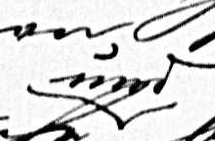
und
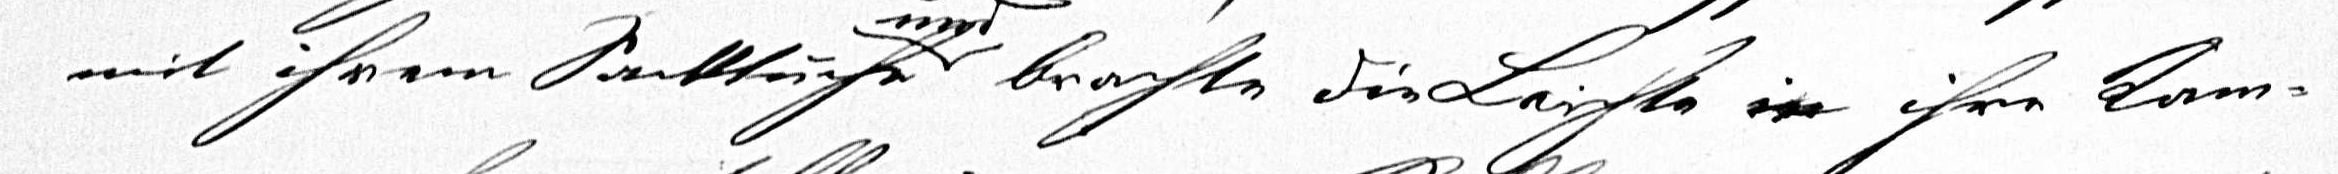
mit ihrem Sacktuche brachte die Leiche in ihre Kam¬
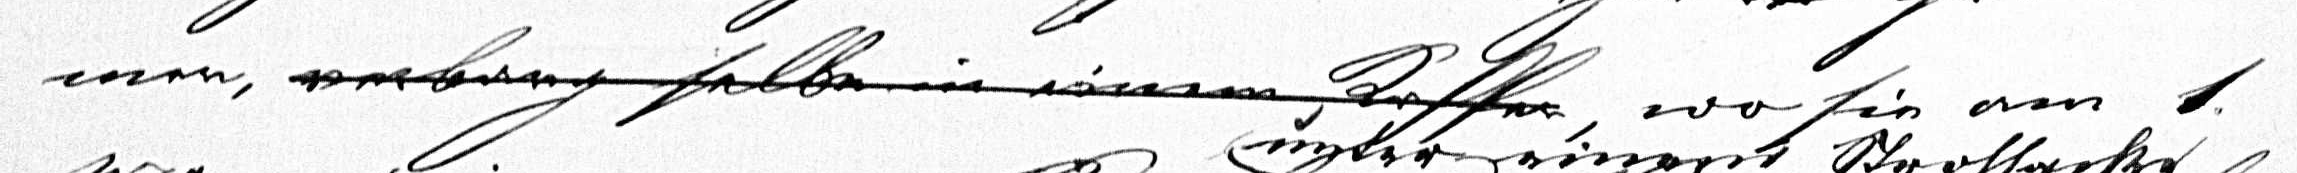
mer, wo sie am 1.
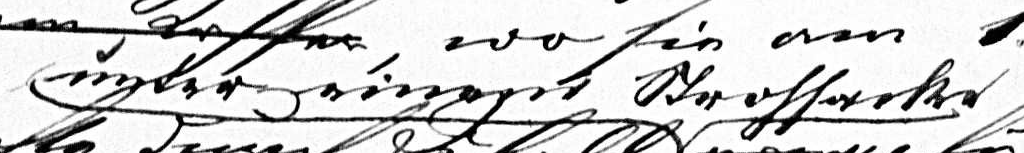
unter einem Strohsacke
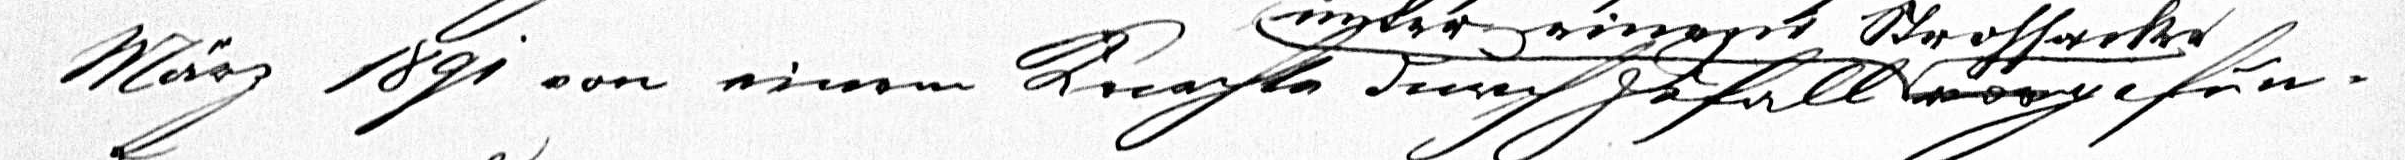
März 1891 von einem Knechte durch Zufall gefun¬
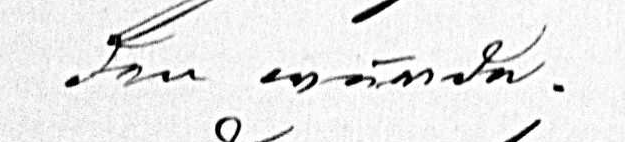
den wurde.
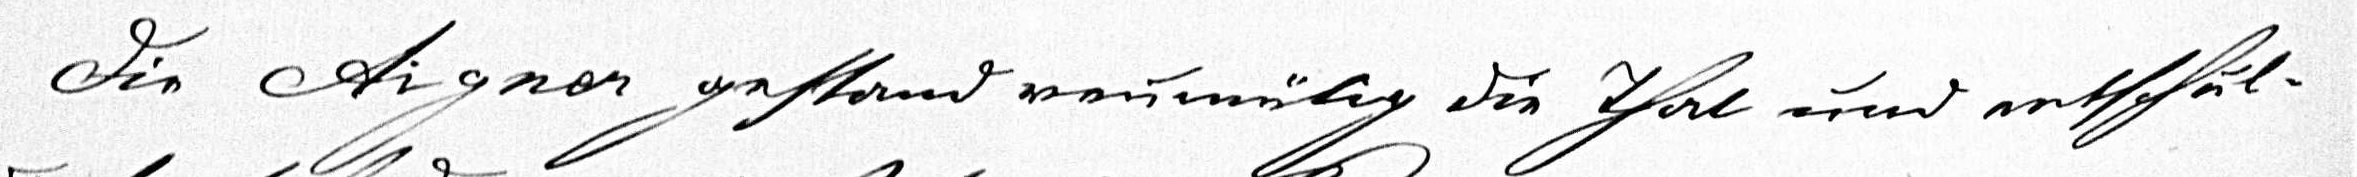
Die Aigner gestand reumütig die That und entschul¬
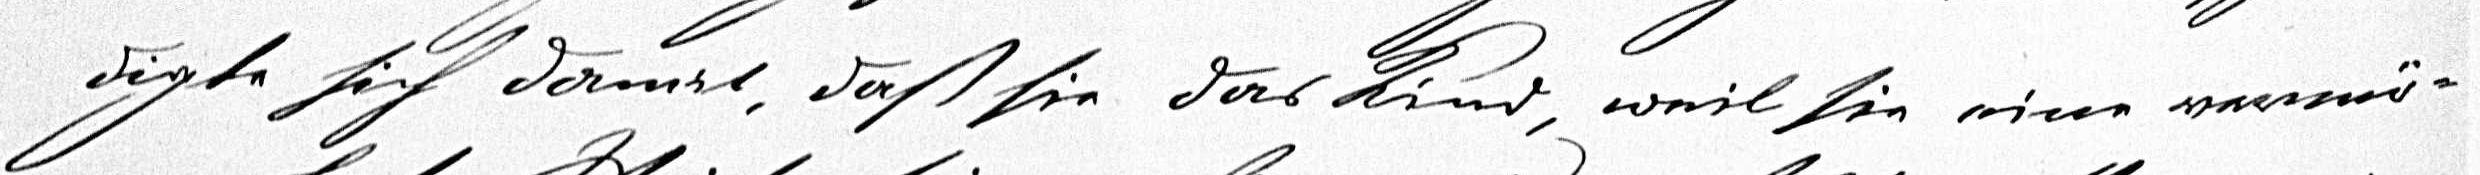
digte sich damit, daß sie das Kind, weil sie eine vermö¬
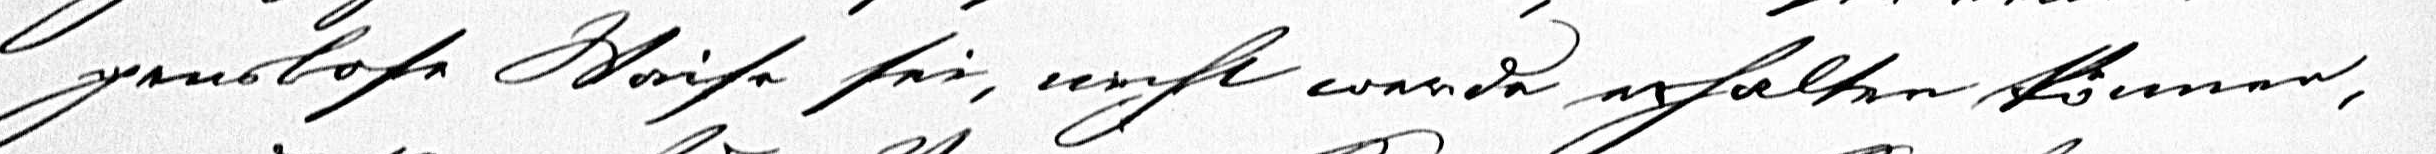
genslose Waise sei, nicht werde erhalten können,
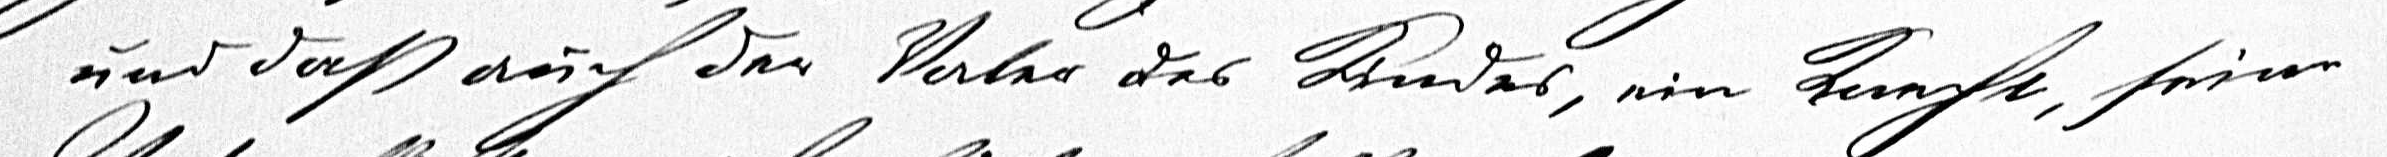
und daß auch der Vater des Kindes, ein Knecht, seine
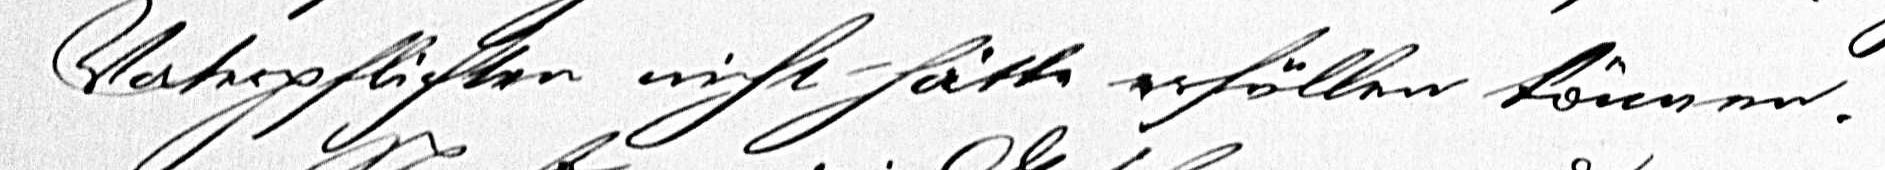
Vaterpflichten nicht hätte erfüllen können.
